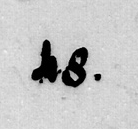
48.
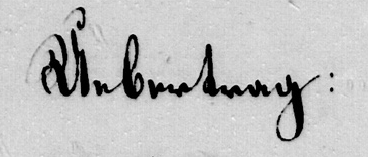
Uebertrag
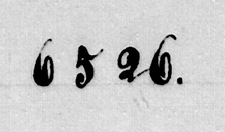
6526.
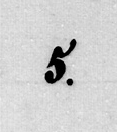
5.
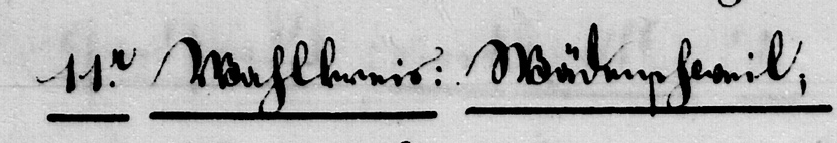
11.r. Wahlkreis: Wädenschweil;
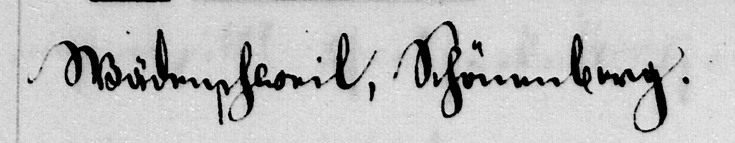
Wädenschweil, Schönenberg.
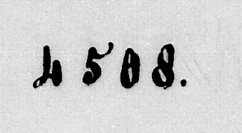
4508.
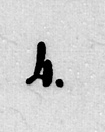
4.
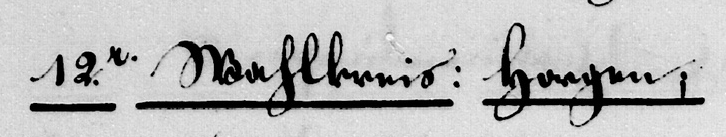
12.r. Wahlkreis: Horgen;
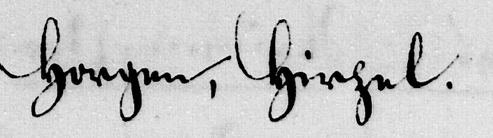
Horgen, Hirzel.
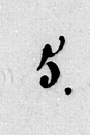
5.
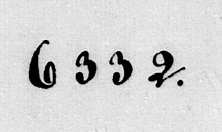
6332.
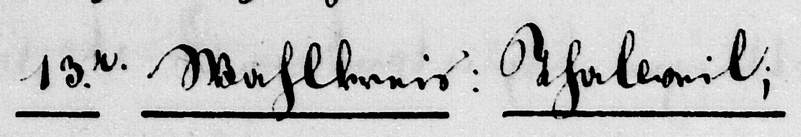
13.r. Wahlkreis: Thalwil;
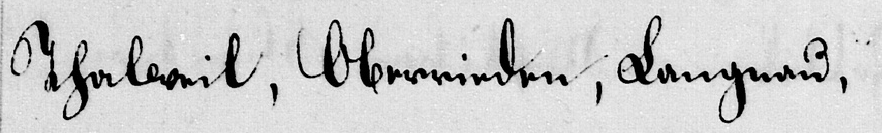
Thalwil, Oberrieden, Langnau,
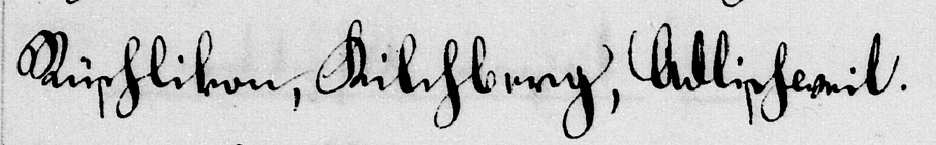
Rüschlikon, Kilchberg, Adlischweil.
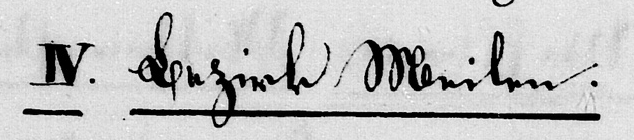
IV. Bezirk Meilen:
